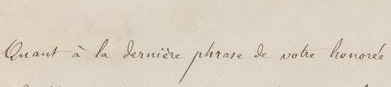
Quant à la dernière phrase de votre honorée
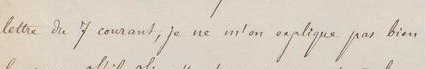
lettre du 7 courant, je ne m'en explique pas bien
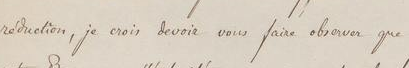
réduction, je crois devoir vous faire observer que
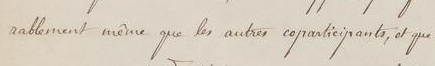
rablement même que les autres coparticipants, et que
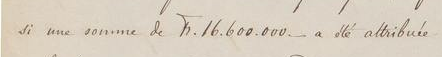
si une somme de Fr. 16.600.000.– a été attribuée
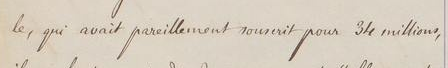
le, qui avait pareillement souscrit pour 34 millions,
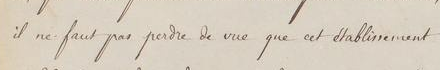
il ne faut pas perdre de vue que cet établissement
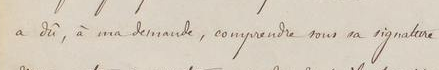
a dû, à ma demande, comprendre sous sa signature
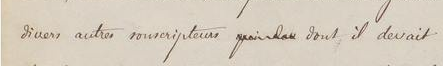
divers autres souscripteurs qui don dont il devait
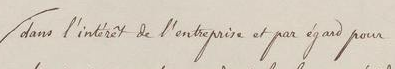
dans l'intérêt de l'entreprise et par égard pour
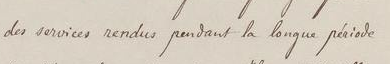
des services rendus pendant la longue période
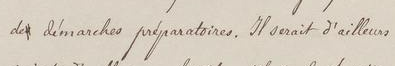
des démarches préparatoires. Il serait d'ailleurs
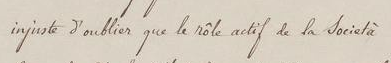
injuste d'oublier que le rôle actif de la Società
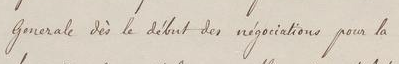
Generale dès le début des négociations pour la
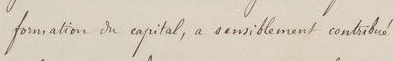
formation du capital, a sensiblement contribué
